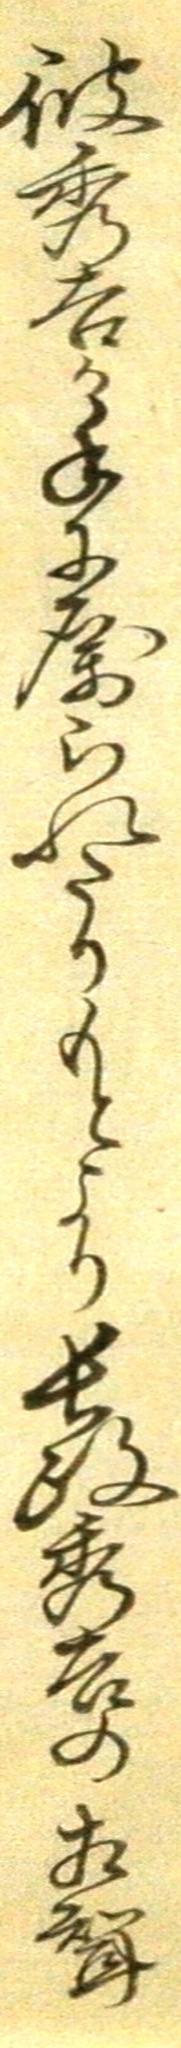彼秀吉か手に属られたりもとより長政秀吉の相聟
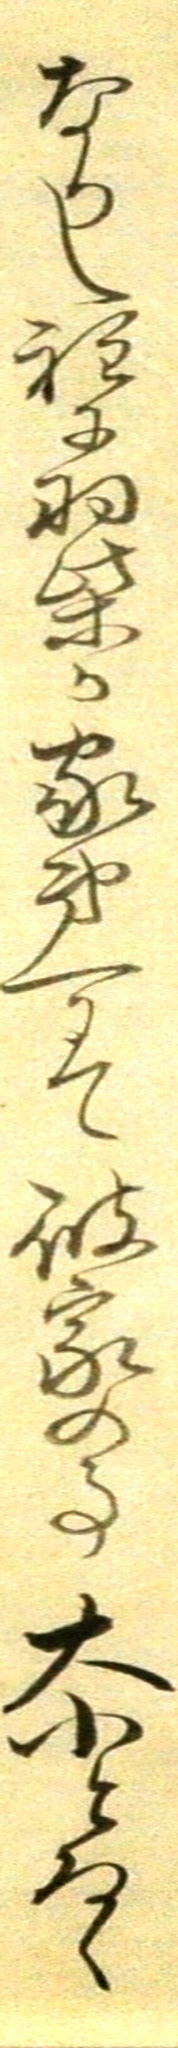なりし程に羽柴か家第一にて彼家の事大小となく
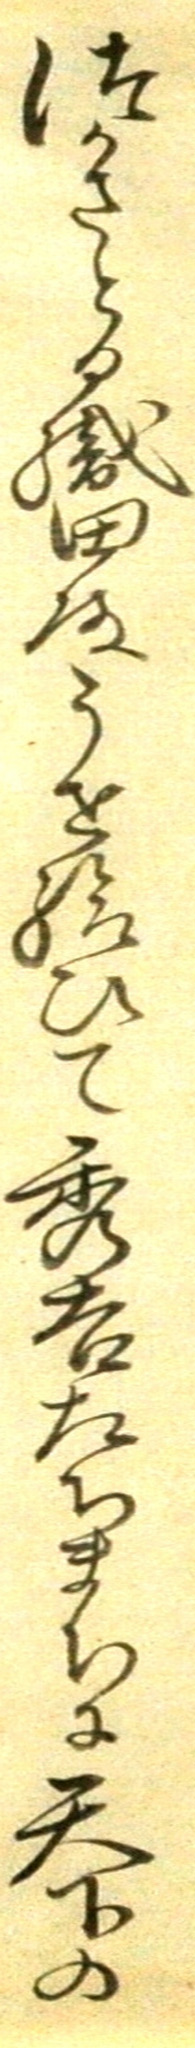つかさとる織田殿うせ給ひて秀吉たちまちに天下の
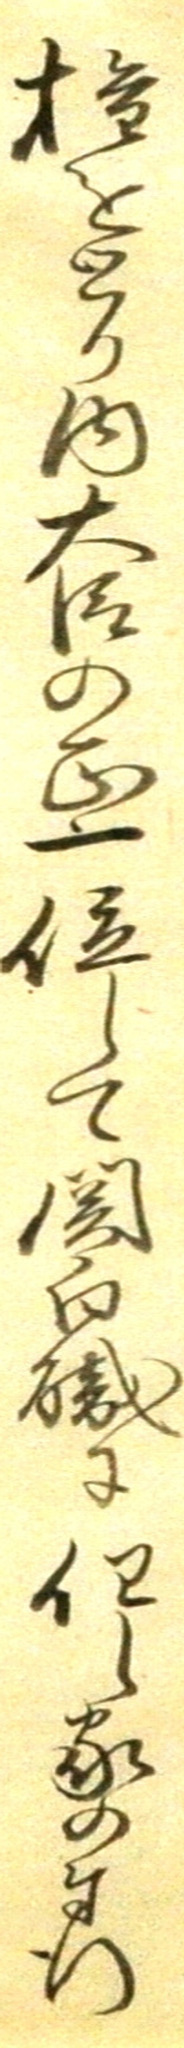権をとり内大臣の正一位して関白職に任し家の奉行
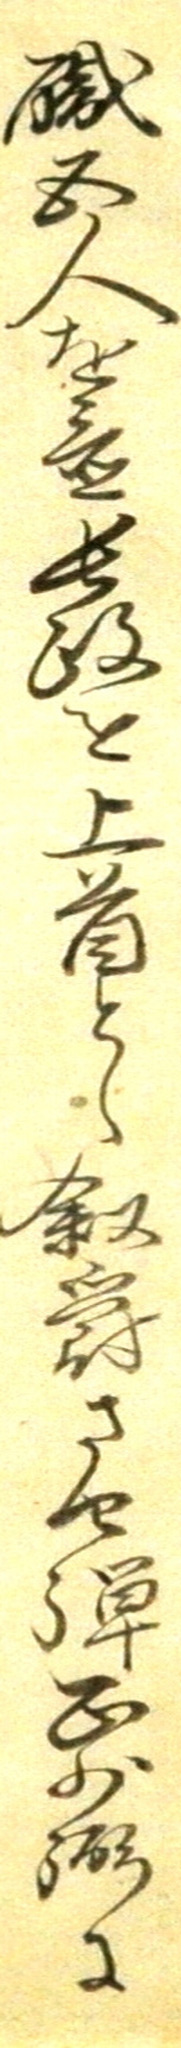職五人を置長政を上首とし叙爵させ弾正少弼に
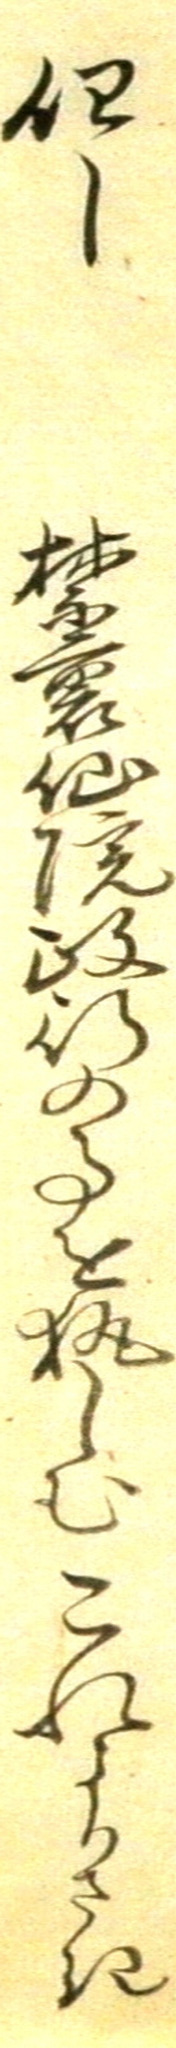任し禁裏仙院政行の事を執しむこれよりさき
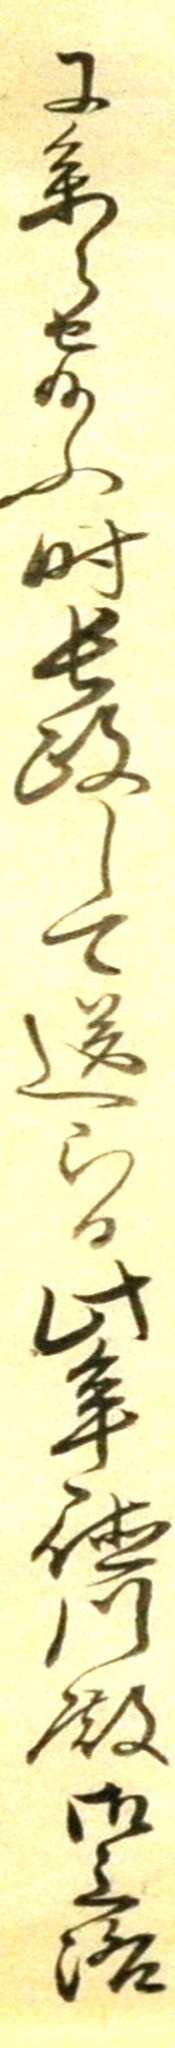に参らせ給ふ時長政して送らる此年徳川殿御上洛
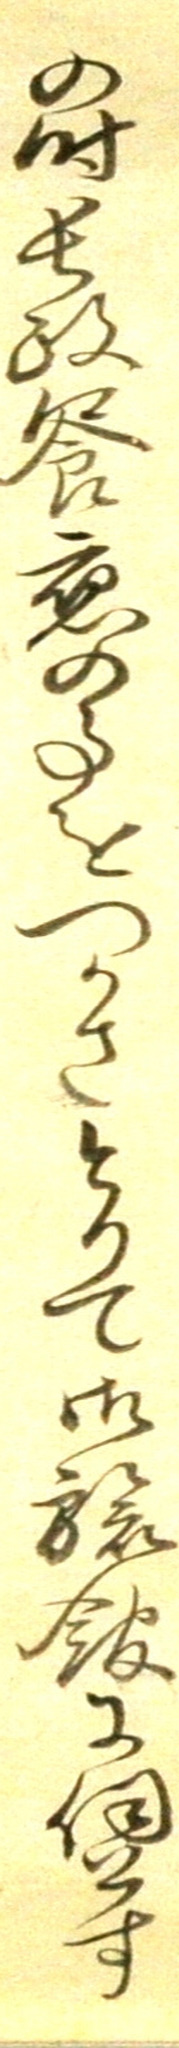の時長政饗応の事をつかさとりて御旅館に伺公す
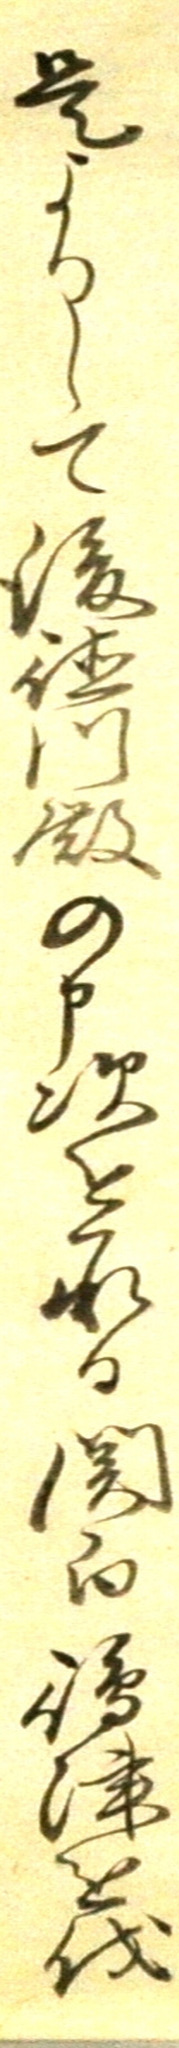是よりして後徳川殿の申次を承る関白島津を伐
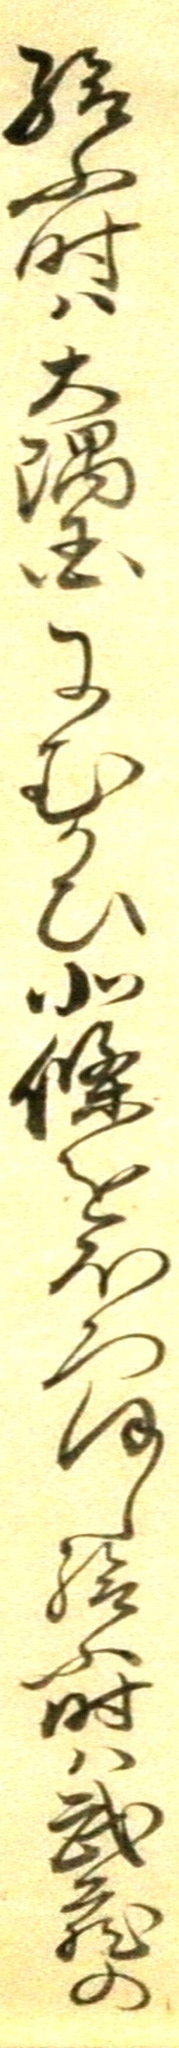給ふ時は大隅国にむかひ北条をほろほし給ふ時は武蔵の
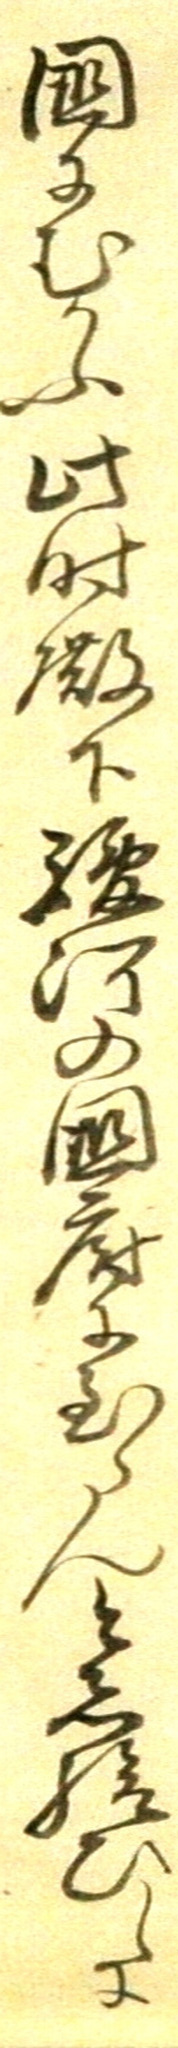国にむかふ此時殿下駿河の国府に至らんとし給ひしに
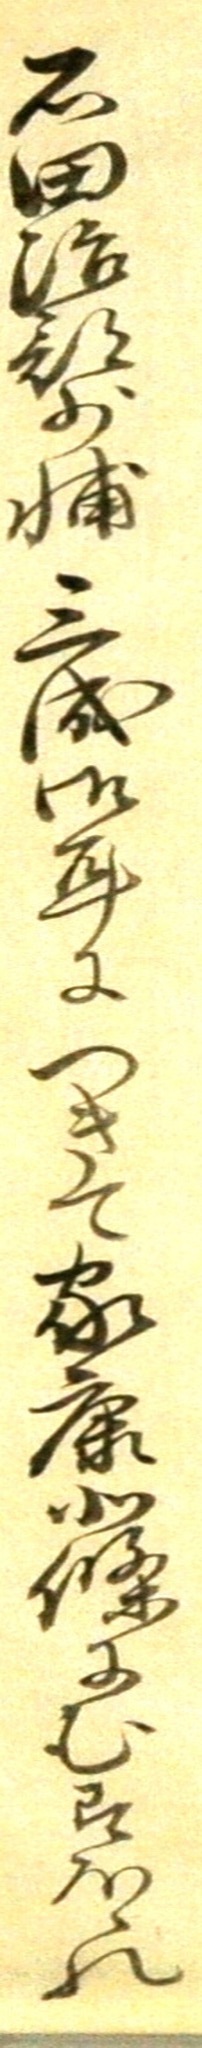石田治部少輔三成御耳につきて家康北条にむすほゝれ
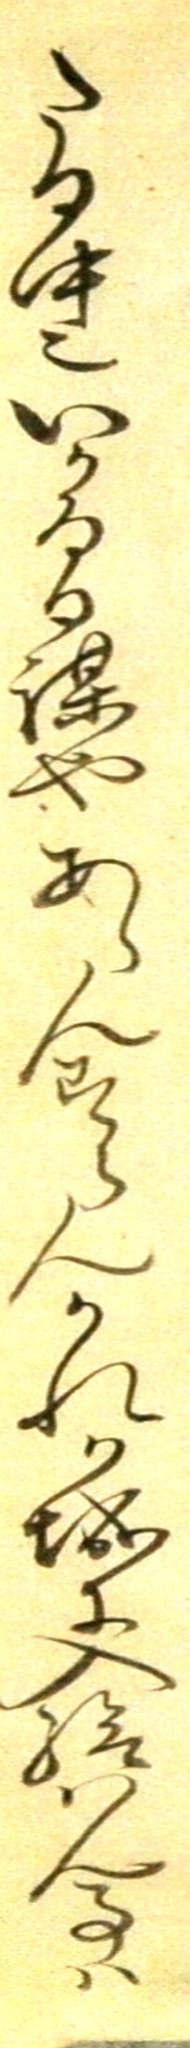たる中也いかなる謀やあらんすらんかれか城に入給はん事は
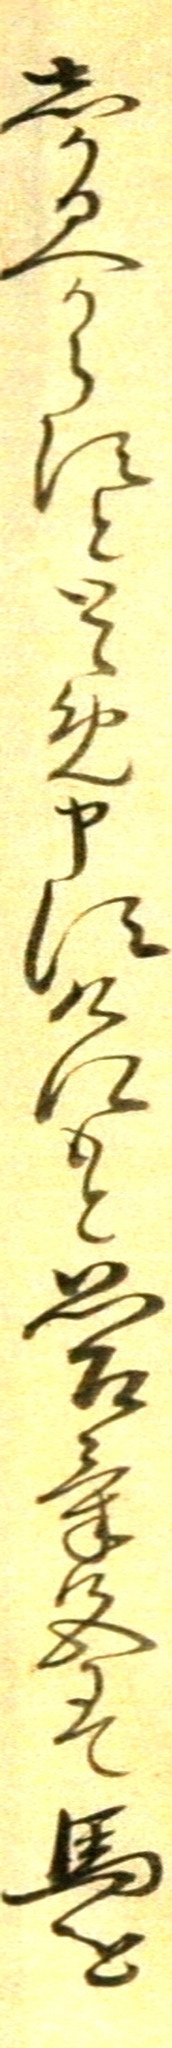しかるへからすととゝめ申すけにもと思召気色にて馬を

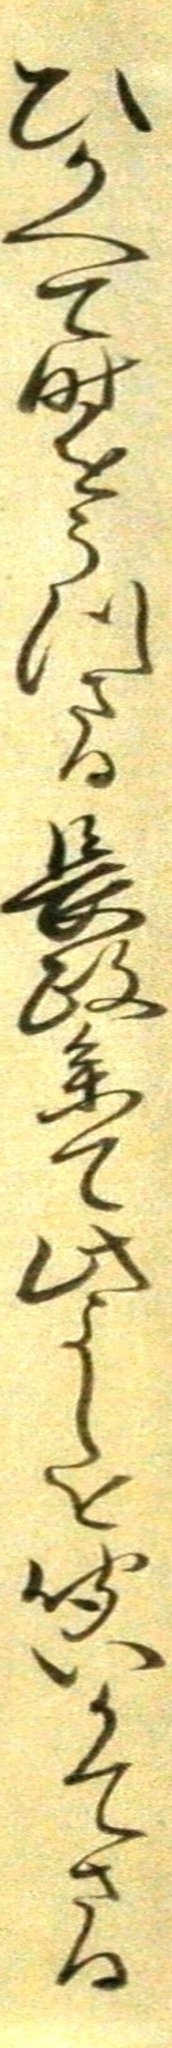ひかへて時をうつさる長政参て此よしを聞いかてさる
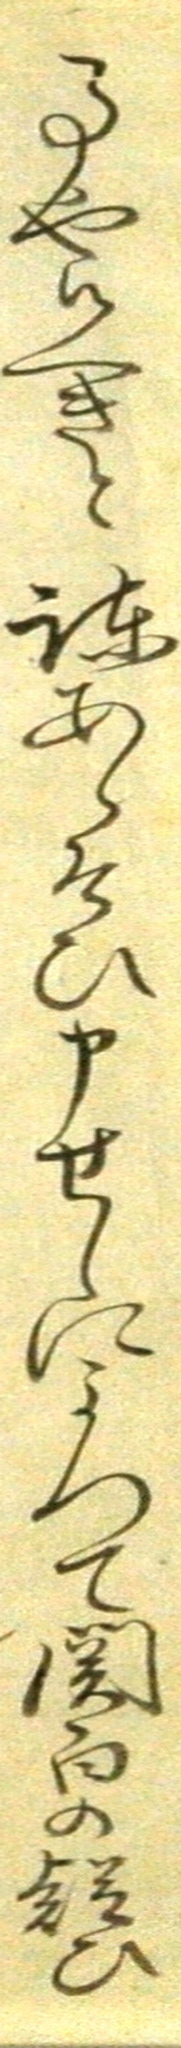事や候へきと諫あらそひ申せしによつて関白の疑ひ
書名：藩翰譜（七・上）
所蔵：伊那市立高遠町図書館・合同会社AMANE
